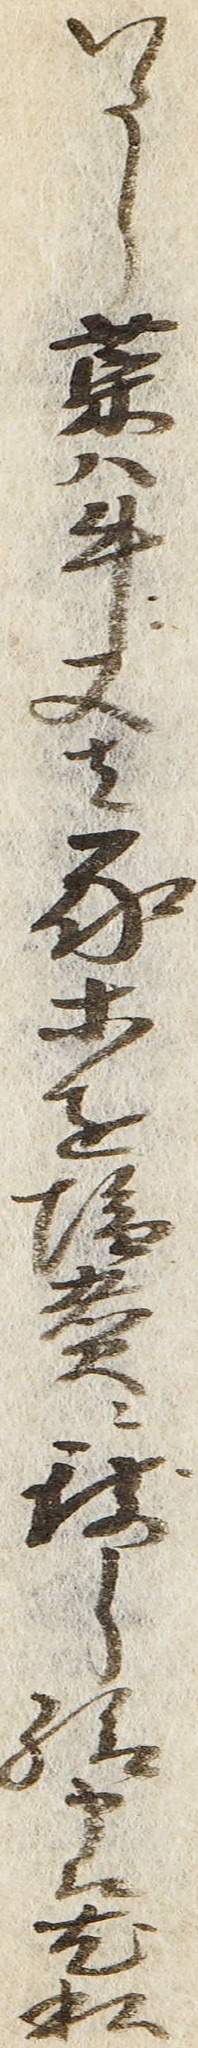いたし菜ハ牛又者豕等を塩煑ニ致し給申候尤私
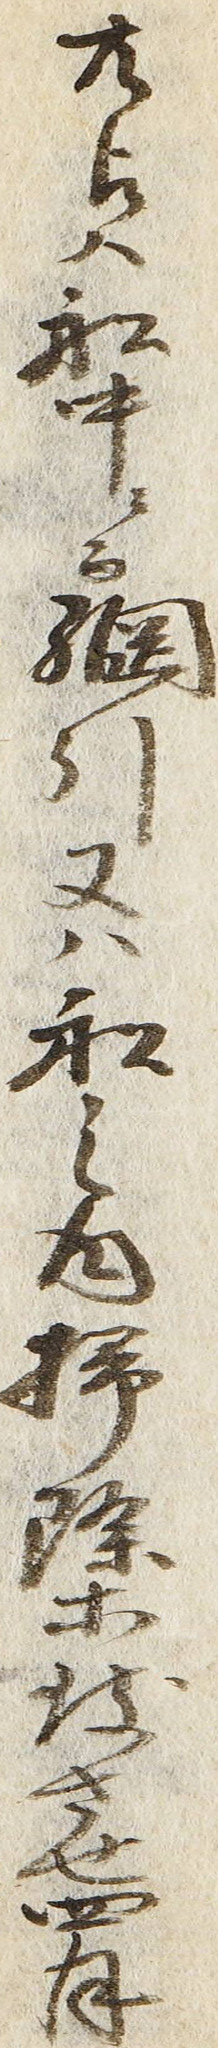共江ハ舩中ニ而綱引又ハ舩之内掃除等致させ四月
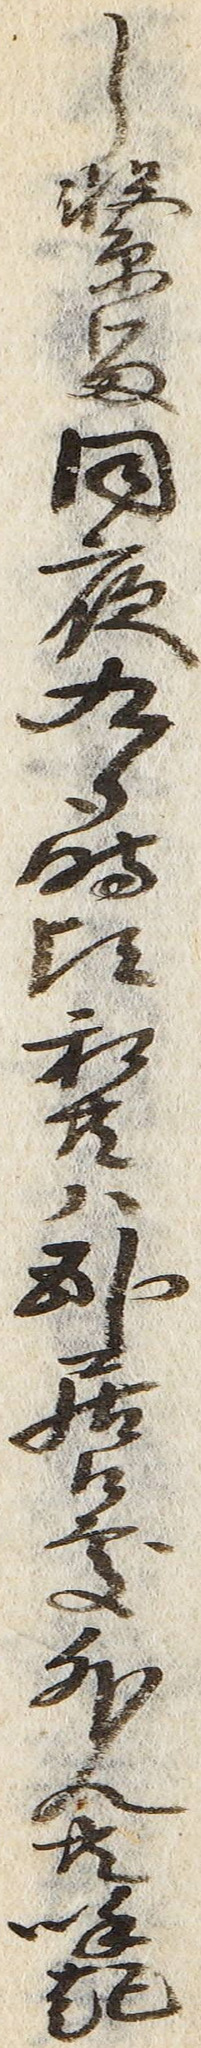し繋留同夜九ツ時比私共ハ臥居候處外人共呼起
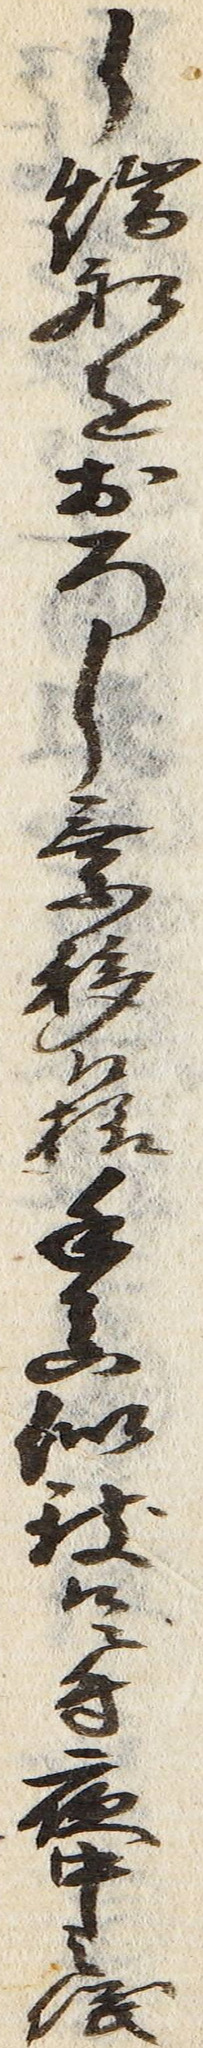し端舩をおろし乗移候様手真似致候ニ付夜中之儀
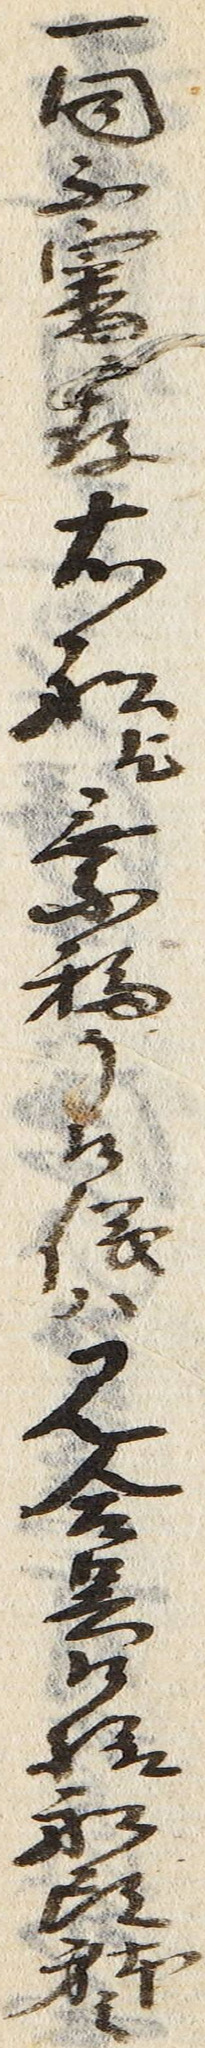一同不審ニ存右舩江乗移り候儀ハ見合呉候様船頭躰之
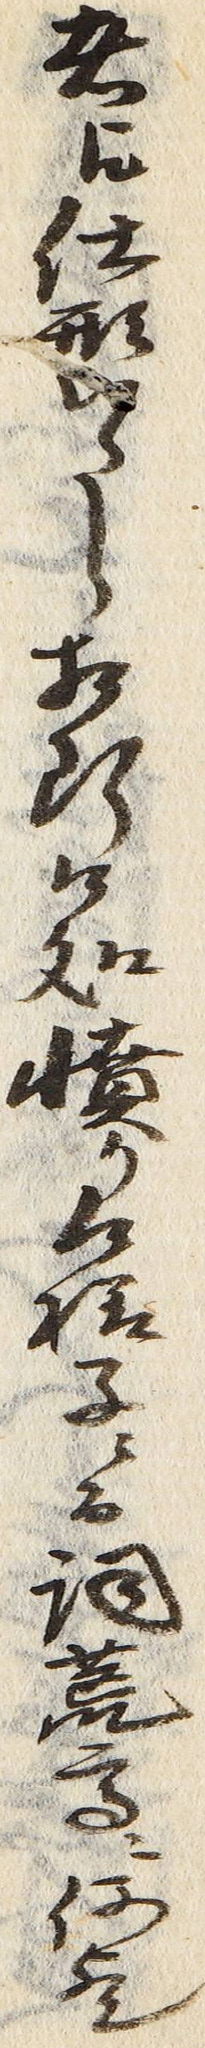者江仕形いたし相断候処憤り候様子にて詞荒高ニ何欤
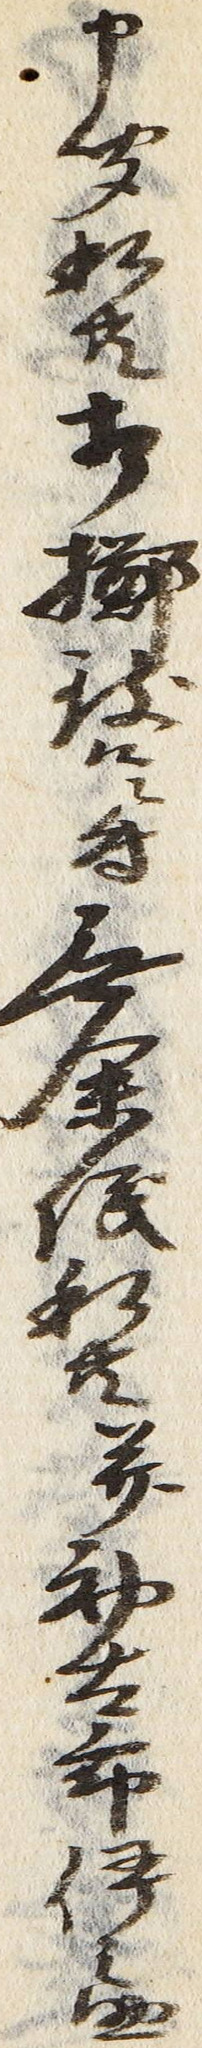申聞私共打擲致候ニ付無余儀私共幷初太郎伊之助
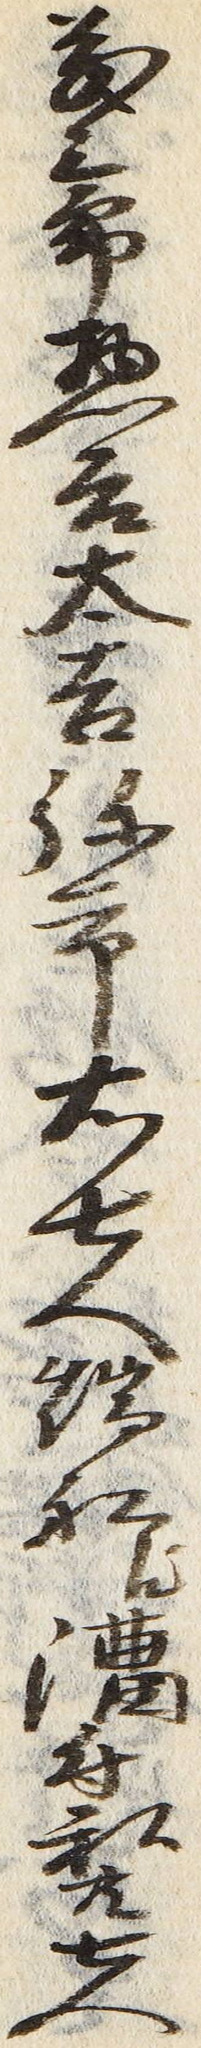茂三郎惣吉太吉弥市右七人端舩江漕付私共七人
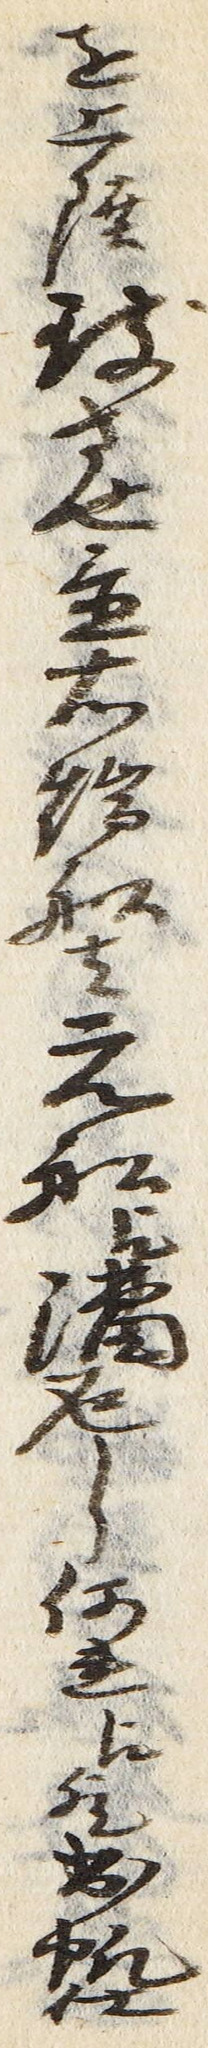を上陸致させ置右端舩者元舩江漕返し何れ江欤出帆仕
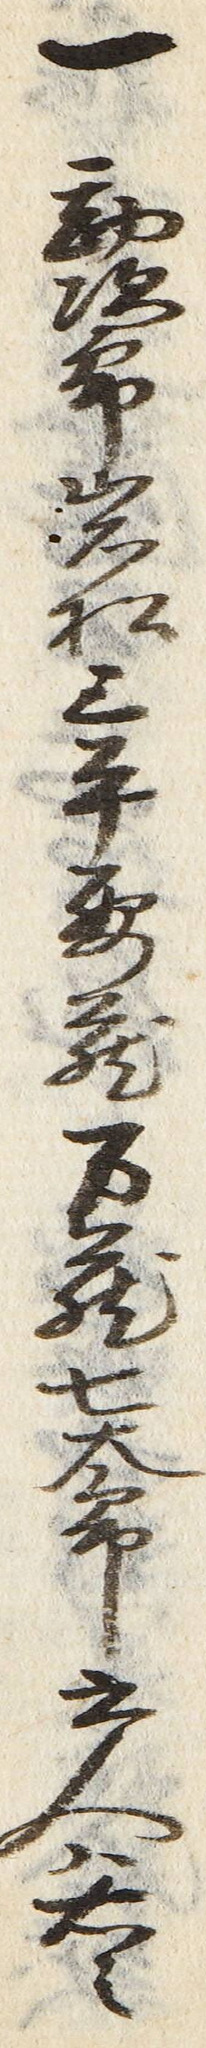一勘次郎岩松三平要蔵万蔵七太郎六人ハ右之
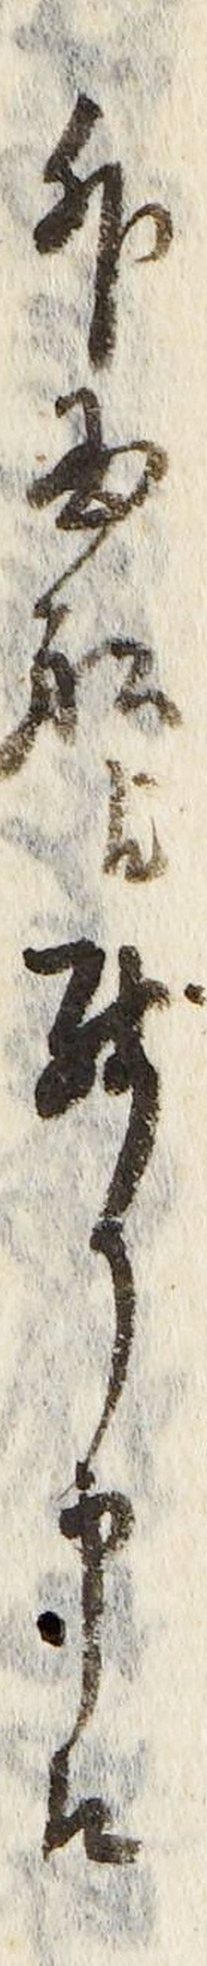外国舩江残り申候
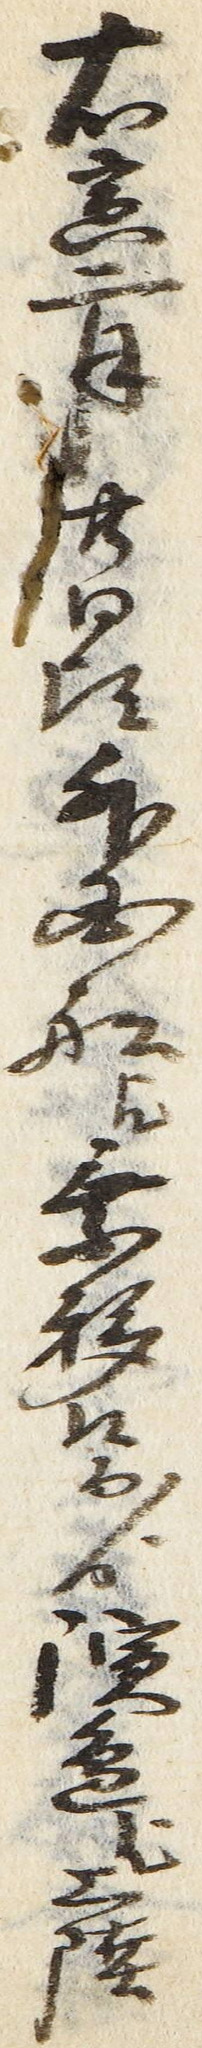右寅二月廿日比外国舩江乗移候而ゟ濱邊江上陸
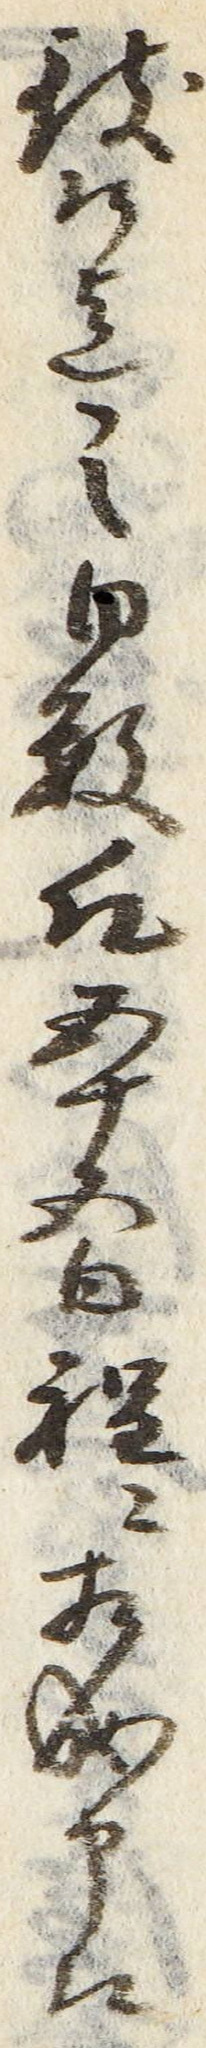致候迄之日数凡五十五日程ニ相成申候

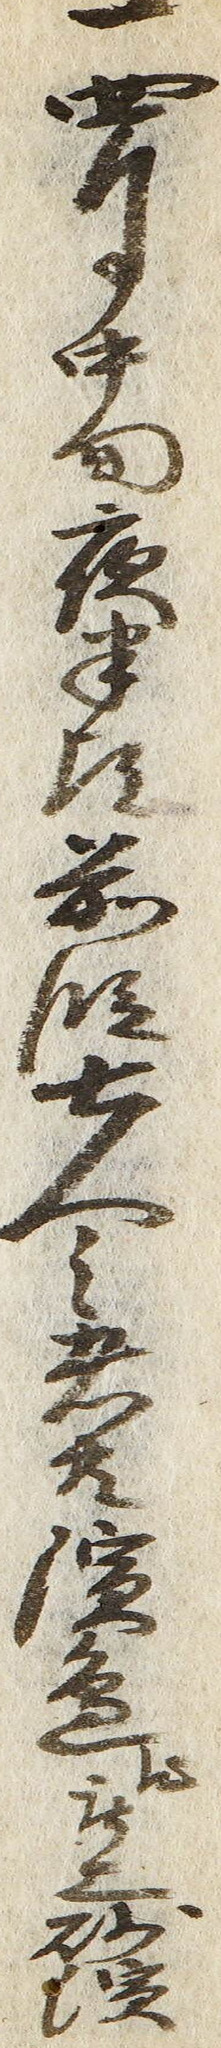一四月中旬夜半比前段七人之者共濱邊江被上砂濱
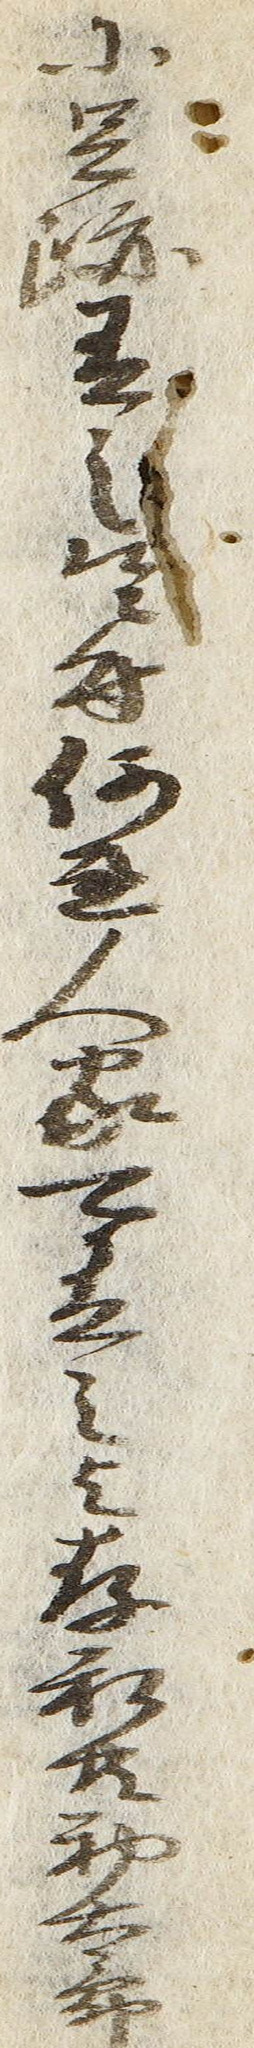に足跡有之候ニ付何れ人家可有之と存私共初太郎
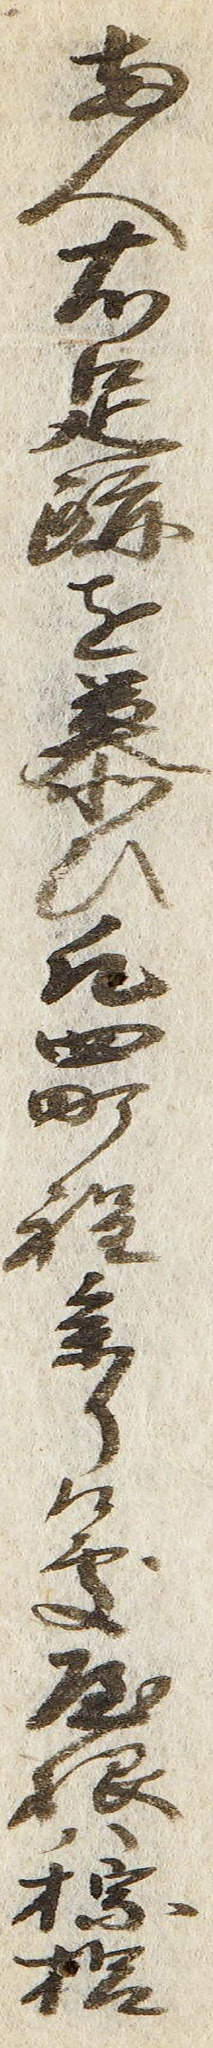両人右足跡を慕ひ凡四町程参り候處屋根ハ棕梠
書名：漂流人善助聞書
